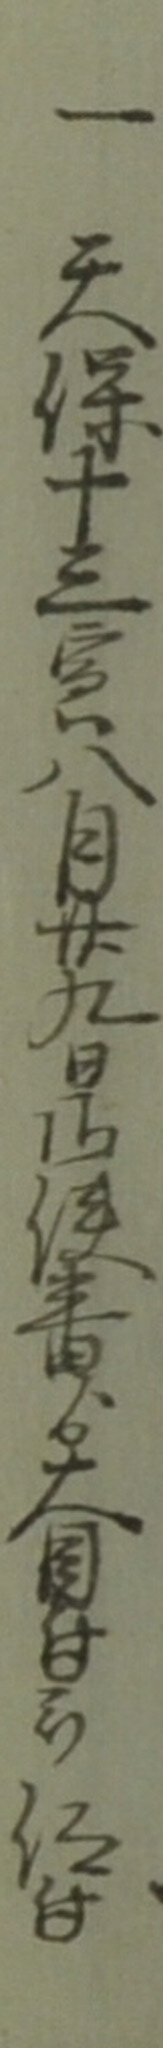一天保十三寅八月廿九日御使番寄大目付被仰付
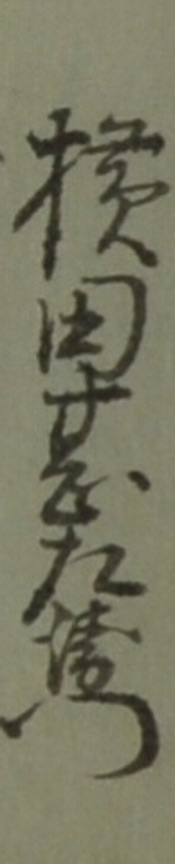横田甚左衛門

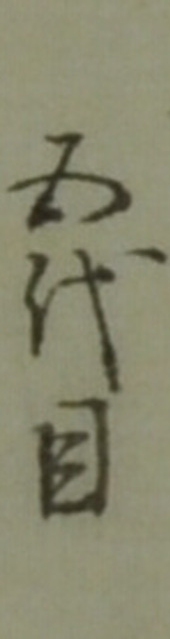五代目
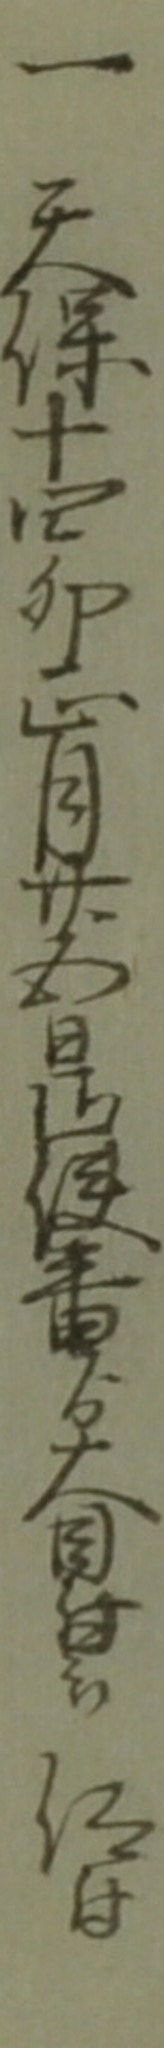一天保十四卯正月廿五日御使番ゟ大目付被仰付
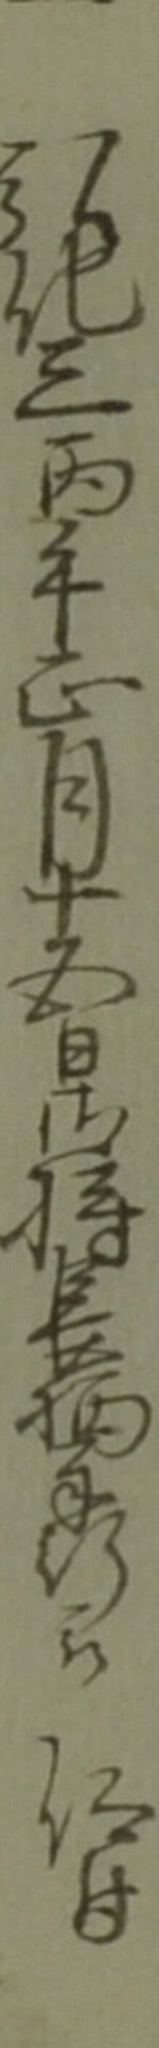一弘化三丙午正月十五日御持長柄奉行被仰付
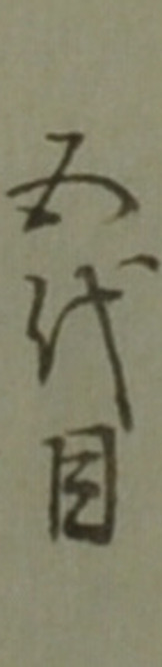五代目
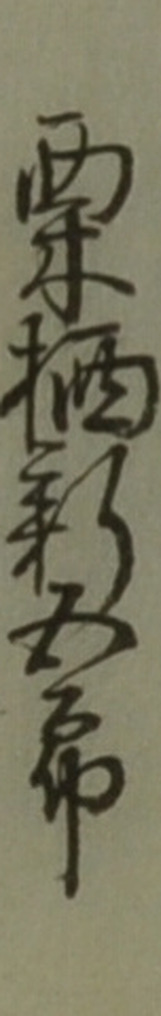栗栖新五郎
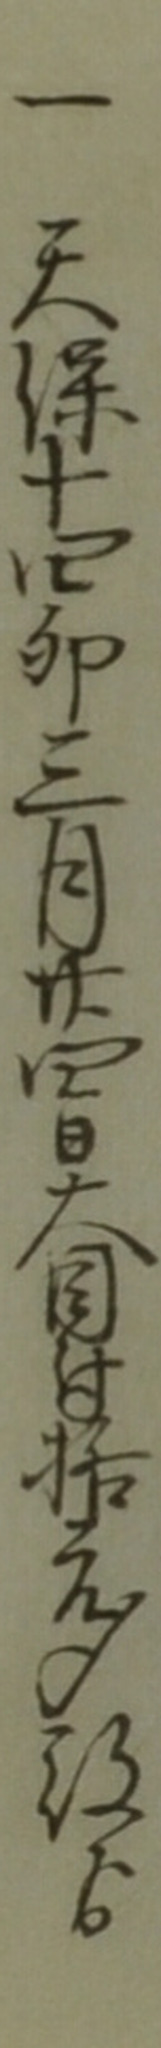一天保十四卯三月廿四日大目付格元〆役ゟ
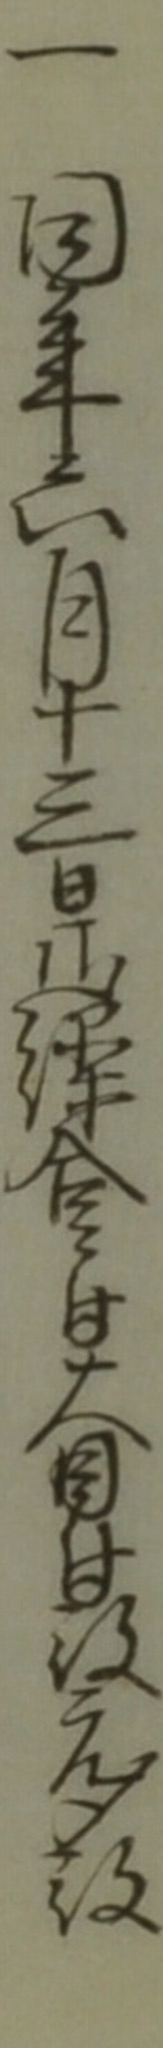一同年六月十三日御繰合ニ付大目付役元〆役
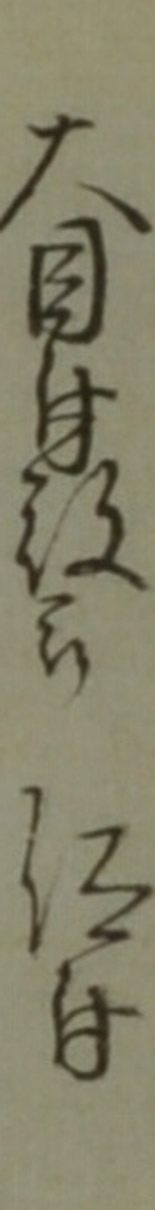大目付役被仰付
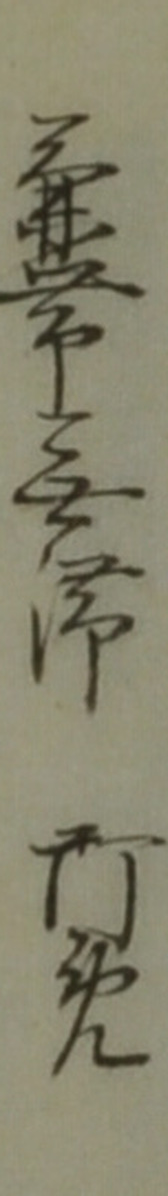兼帯無滞御免
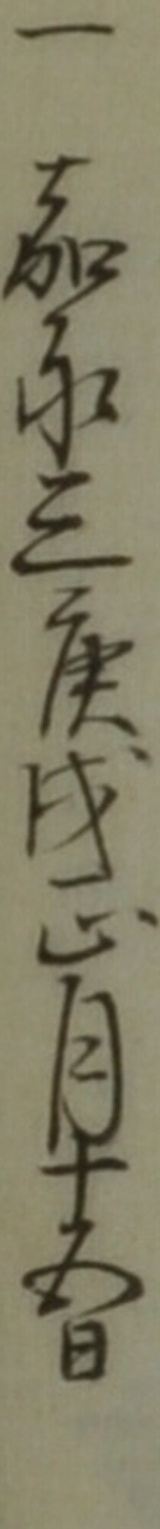一嘉永三庚戌正月十五日
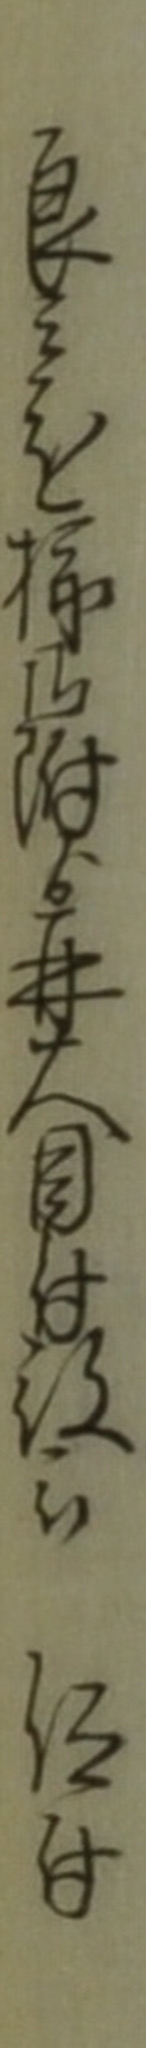良之進様御附ゟ再大目付役被仰付
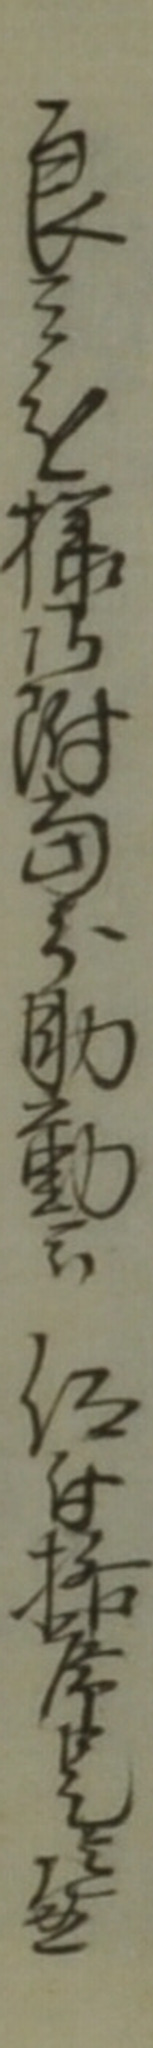良之進様御附当分助勤被仰付格席是迄通
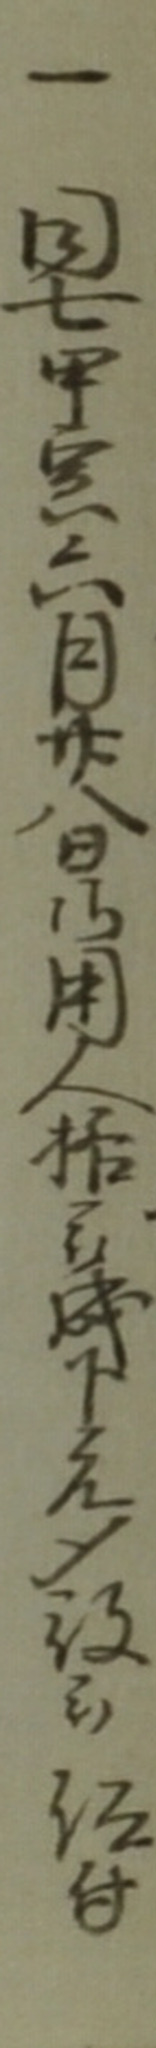一同七甲寅六月廿八日御用人格被成下元〆役被仰付
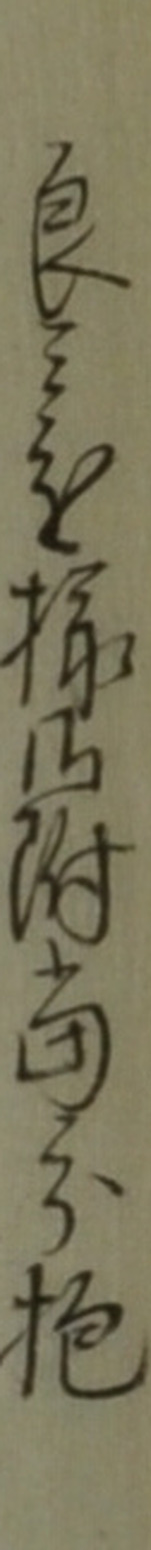良之進様御附当分抱
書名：諸御役代々録（三）
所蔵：伊那市立高遠町図書館・合同会社AMANE
